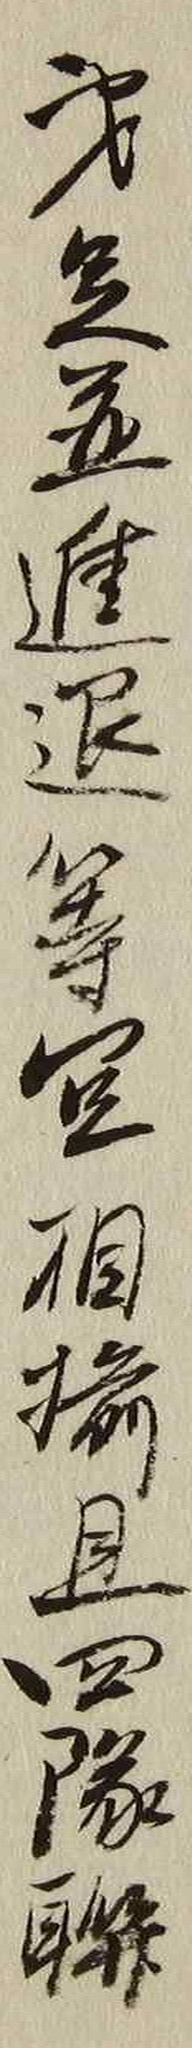第足並進退等宜相揃且四隊聯
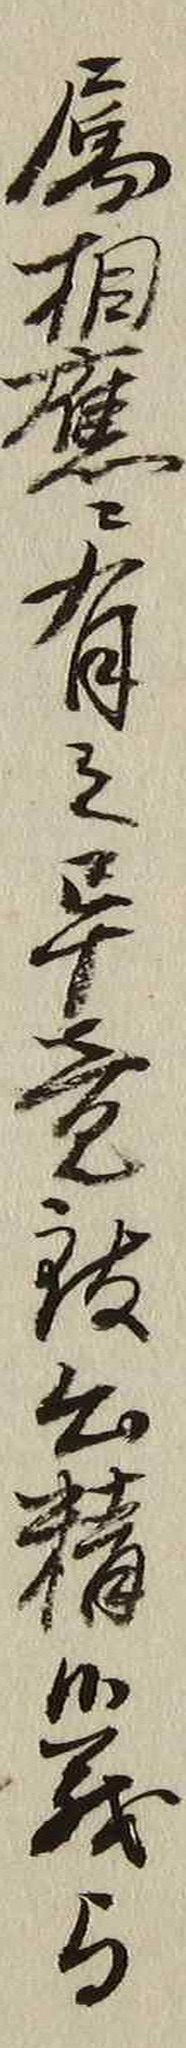属相応ニ有之畢竟致出精御義与
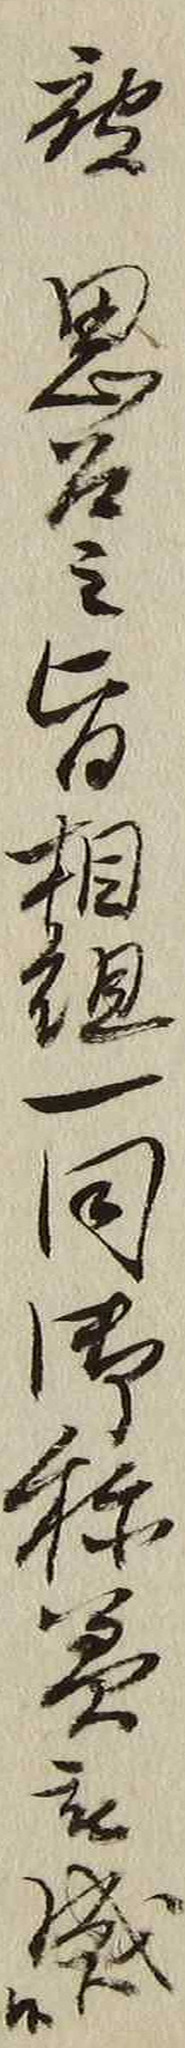被思召之旨相組一同御称美被成下候
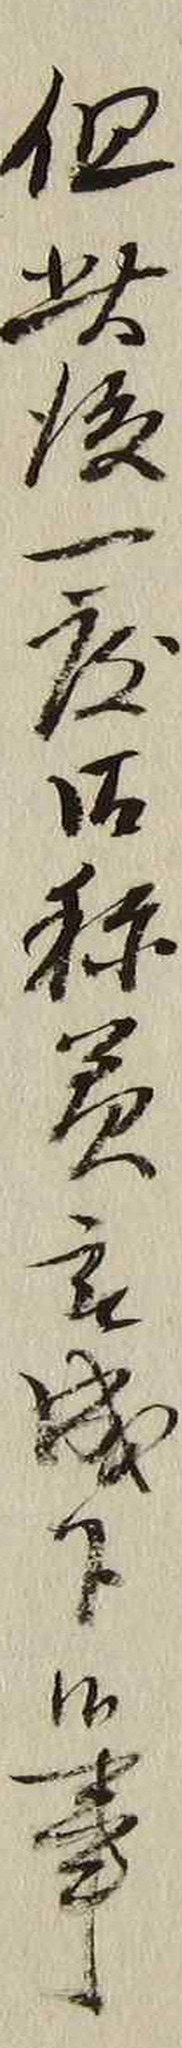但此後一度御称美被成下候
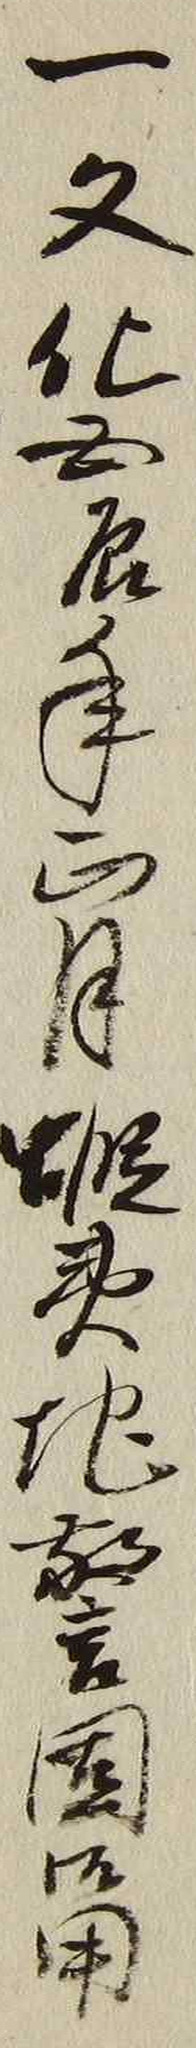一文化五辰年正月蝦夷地警固御用
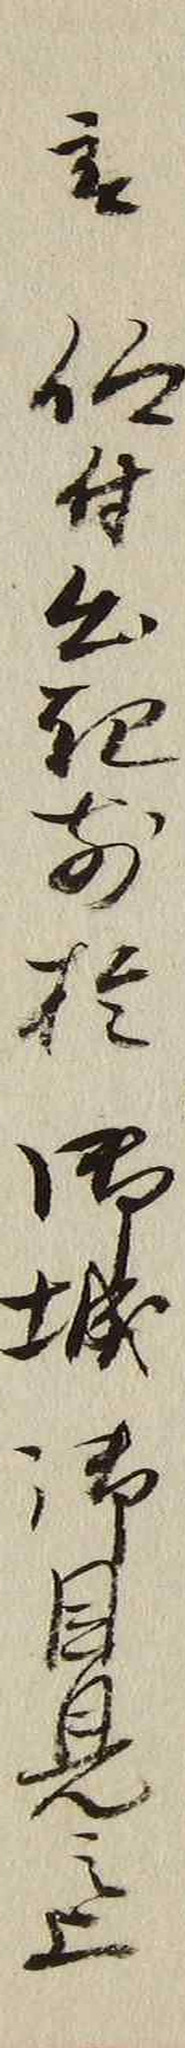被仰付出起前於御城御目見之上
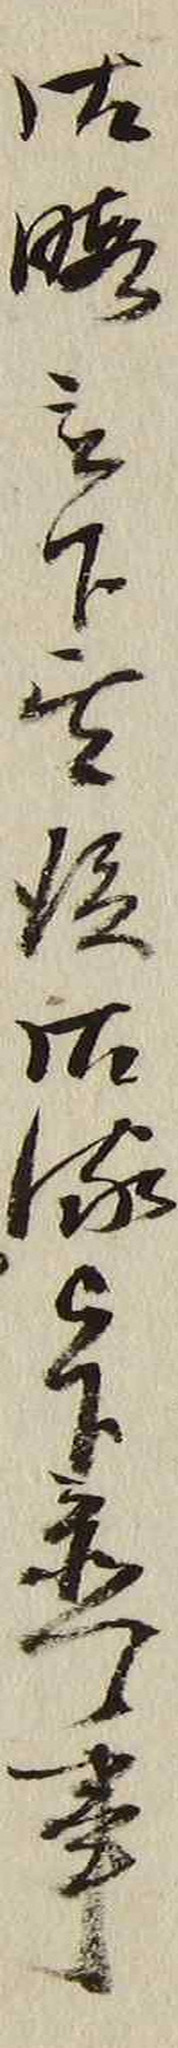御暇被下其後御隊被下置候事

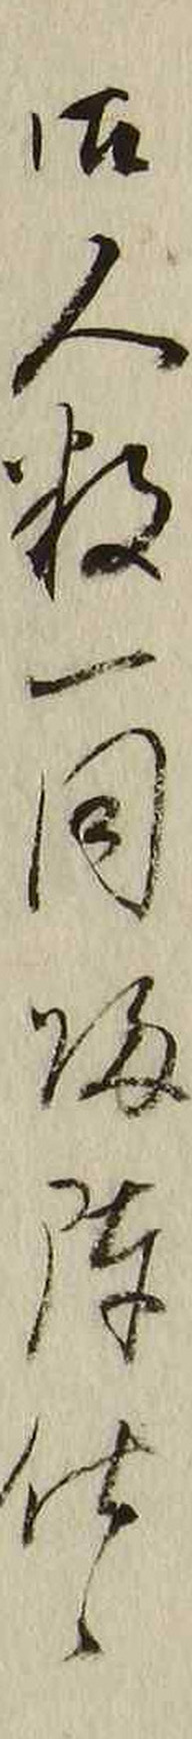御人数一同帰陣仕候
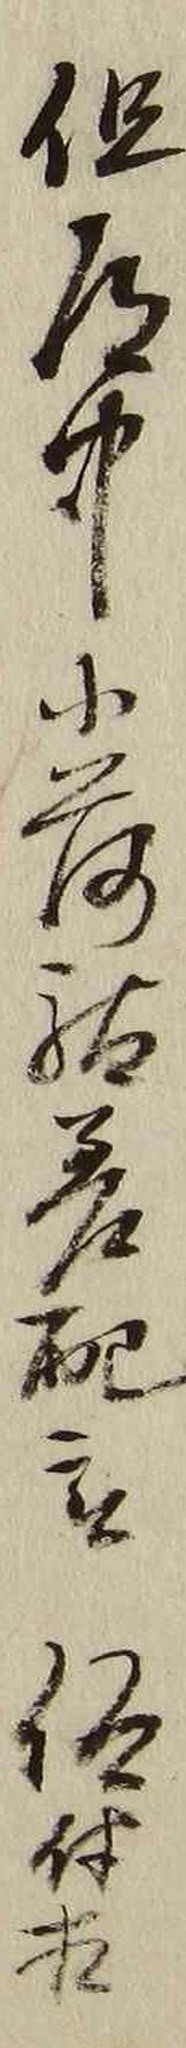但道中小荷駄差配被仰付相
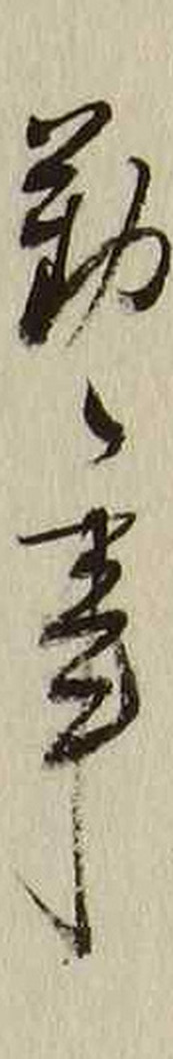勤候事
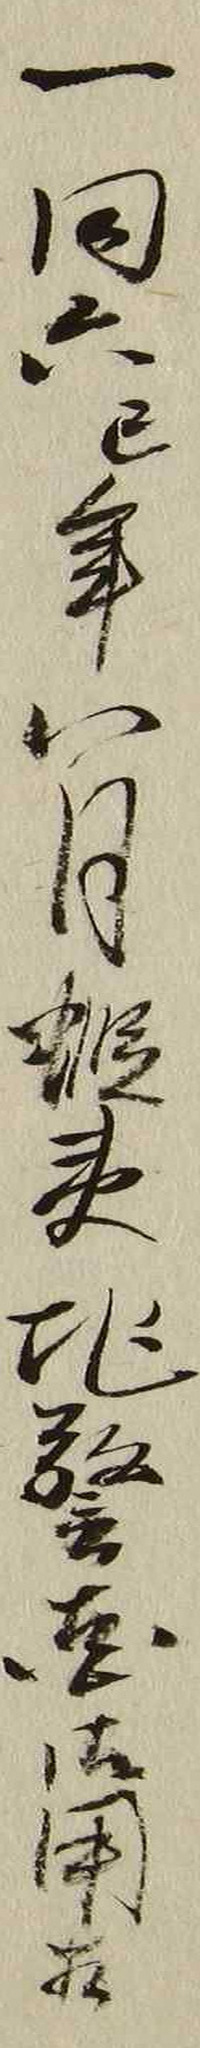一同六巳年八月蝦夷地警固御用相
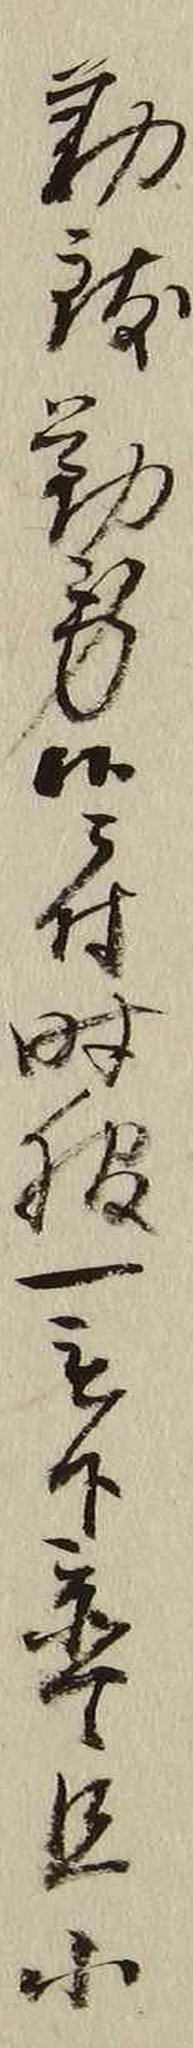勤致勤労候ニ付時服一被下置候且小
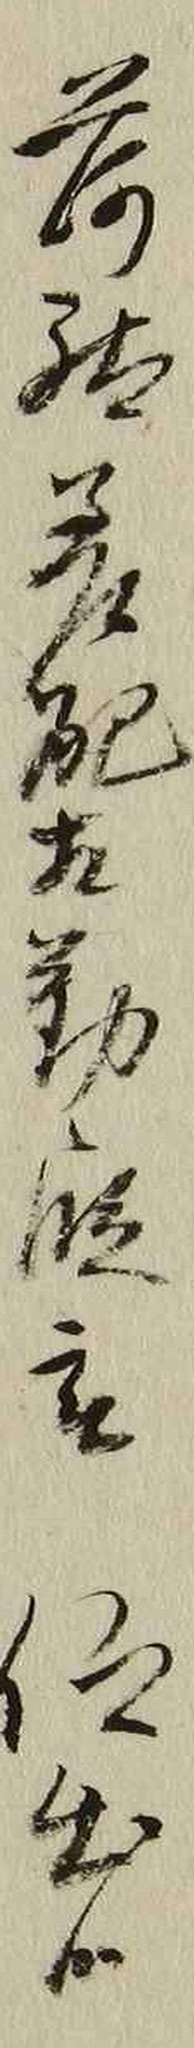荷駄差配相勤候段被仰出候
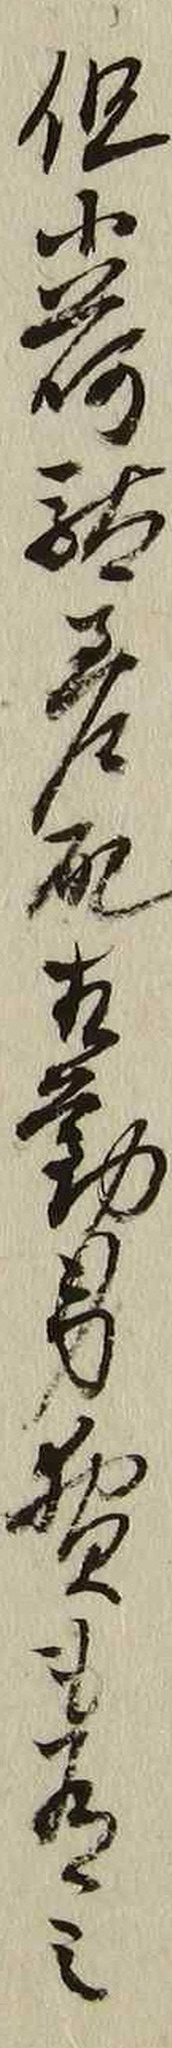但小荷駄差配相勤労費も有之
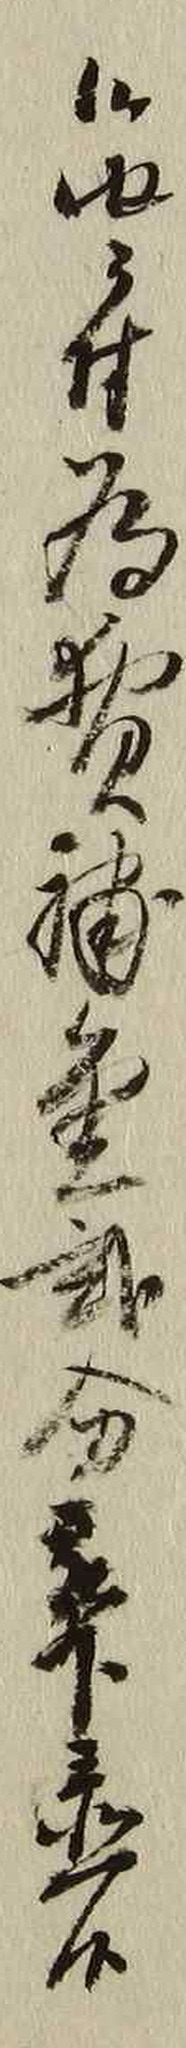候由ニ付為費補金弐分被下置候
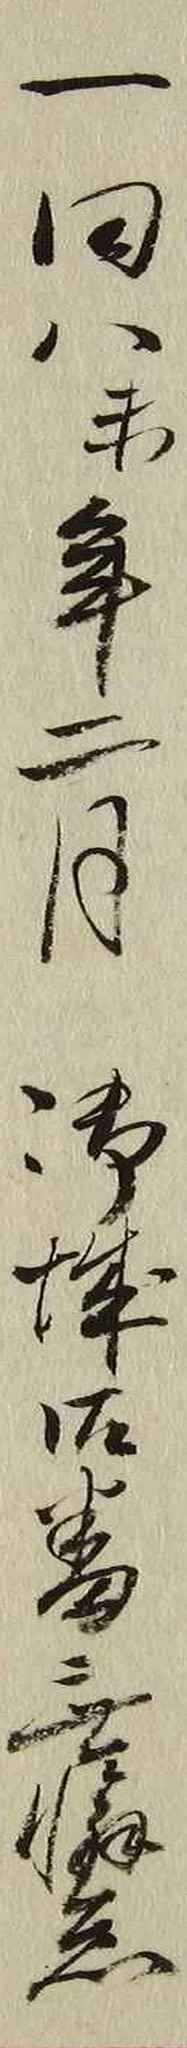一同八未年二月御城御番無懈怠
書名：諸士系譜　巻之352　す之部2
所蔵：会津若松市立会津図書館
